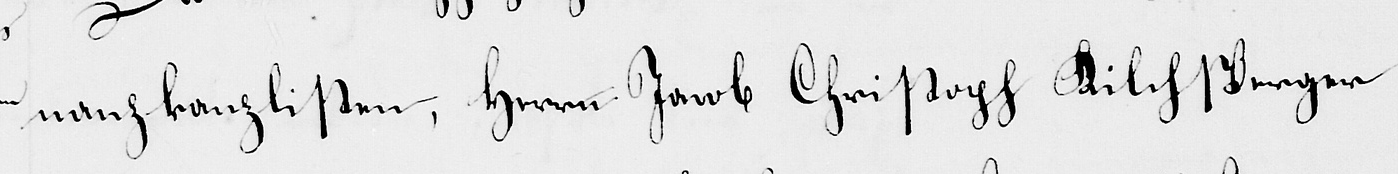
nanzkanzlisten, Herrn Jacob Christoph Kilchsperger
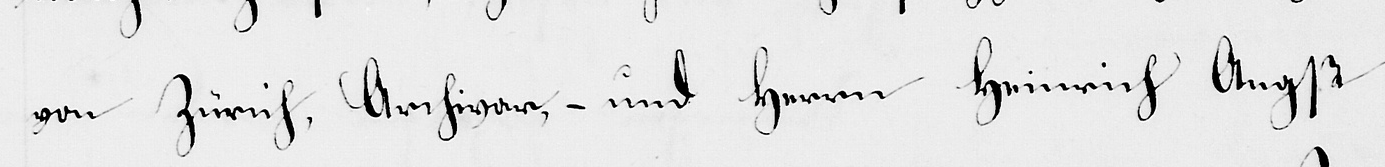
von Zürich, Archivar, – und Herrn Heinrich Angst
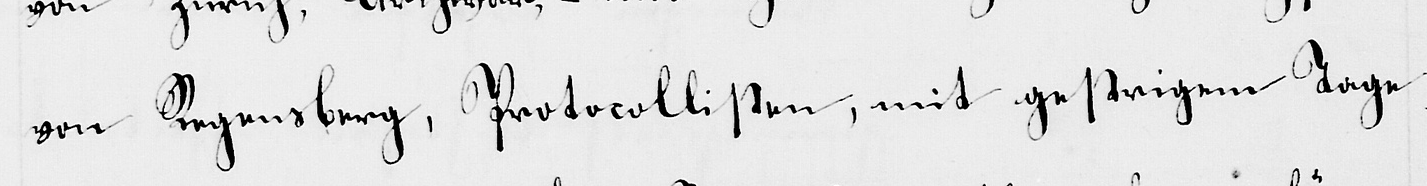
von Regensberg, Protocollisten, mit gestrigem Tage
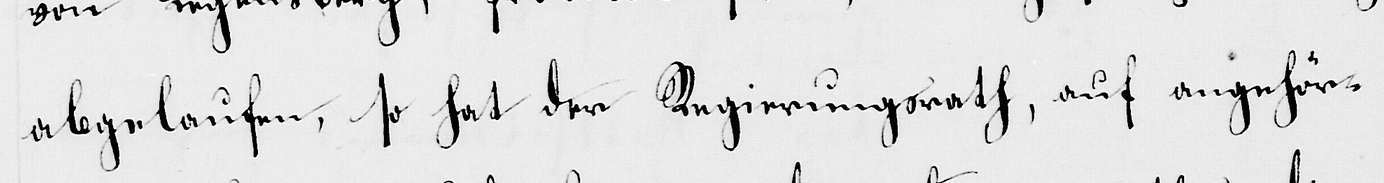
abgelaufen, so hat der Regierungsrath, auf angehör¬
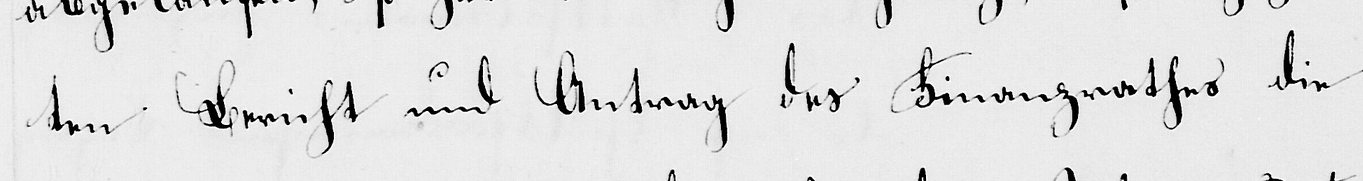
ten Bericht und Antrag des Finanzrathes die
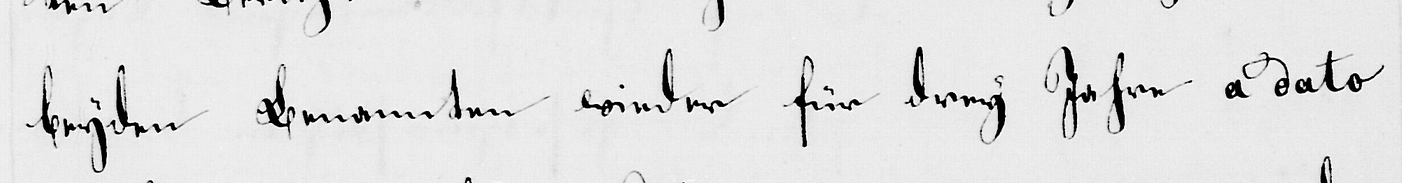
beyden Benannten wieder für drey Jahre a dato
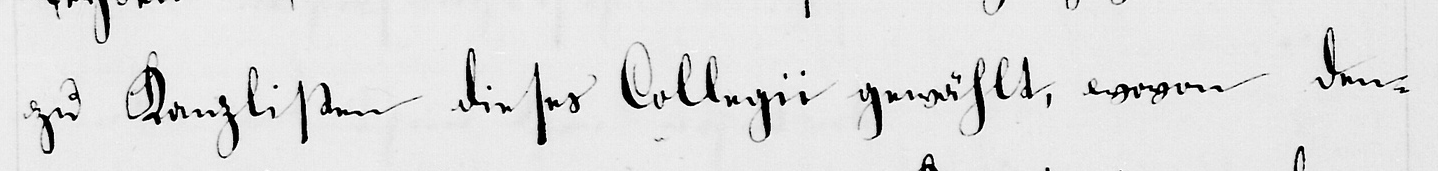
zu Kanzlisten dieses Collegii gewählt, wovon den¬
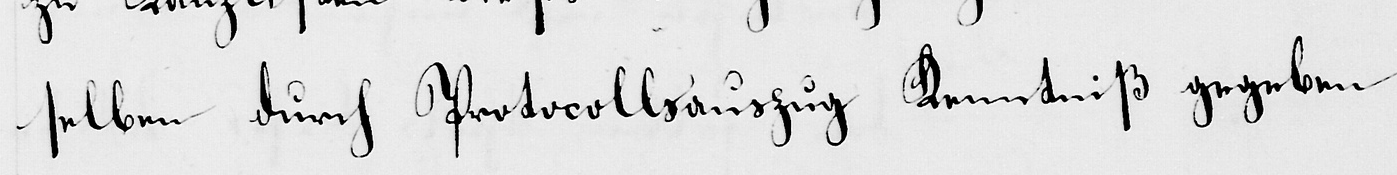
selben durch Protocollsauszug Kenntniß gegeben
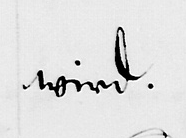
wird.
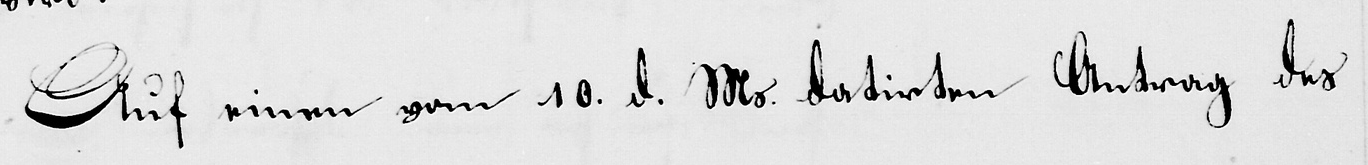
Auf einen vom 10. d. Ms. datirten Antrag des
